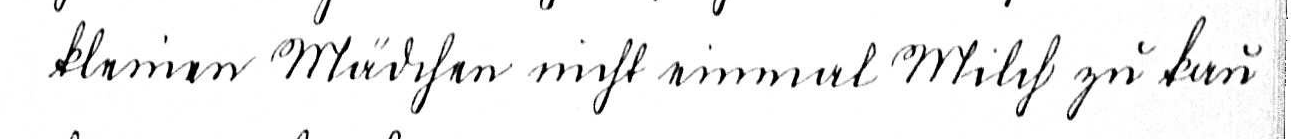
kleinen Mädchen nicht einmal Milch zu kau¬
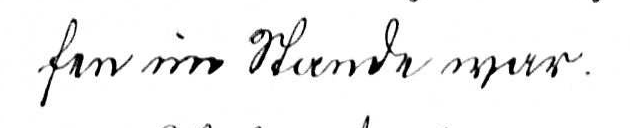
fen im Stande war.
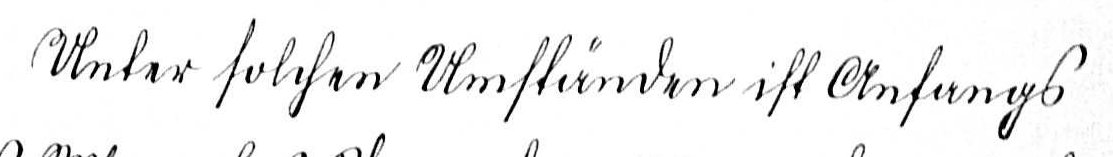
Unter solchen Umständen ist Anfangs
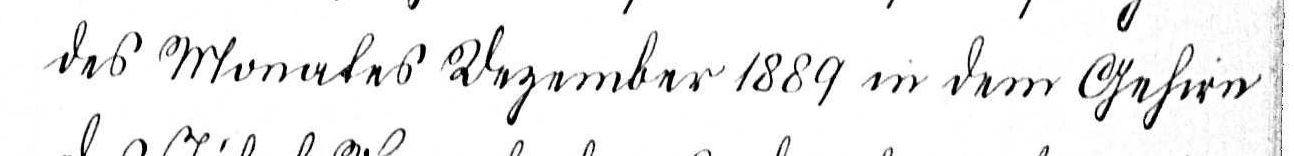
des Monates Dezember 1889 in dem Gehirn
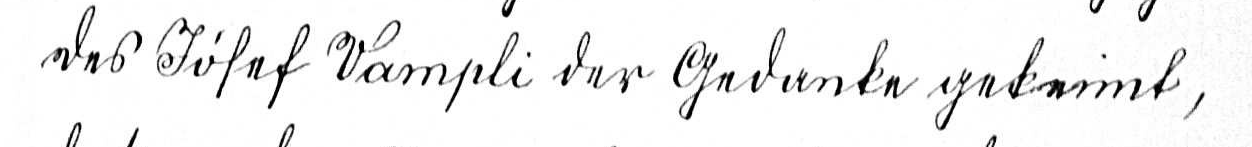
des Jósef Vampli der Gedanke gekeimt,
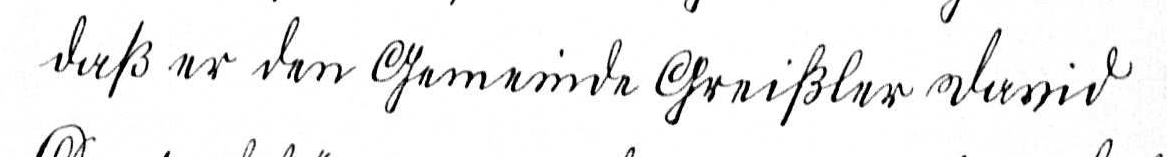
daß er den Gemeinde Greißler David
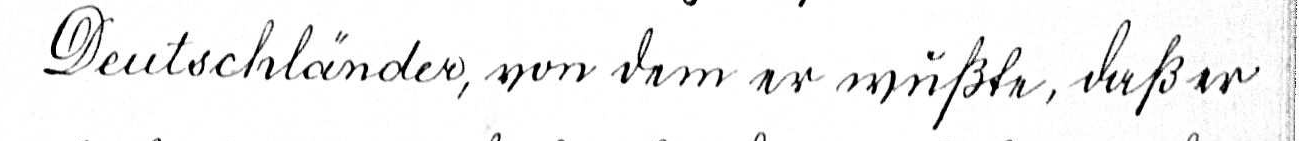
Deutschländer, von dem er wußte, daß er
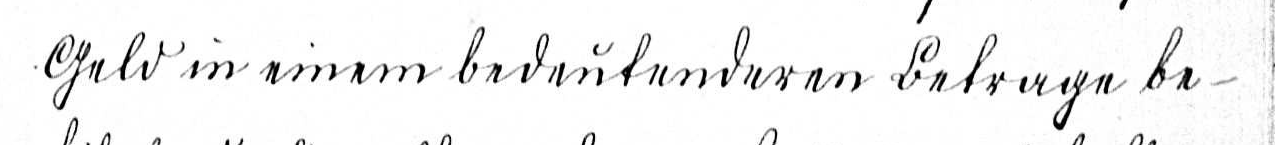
Geld in einem bedeutenderen Betrage be¬
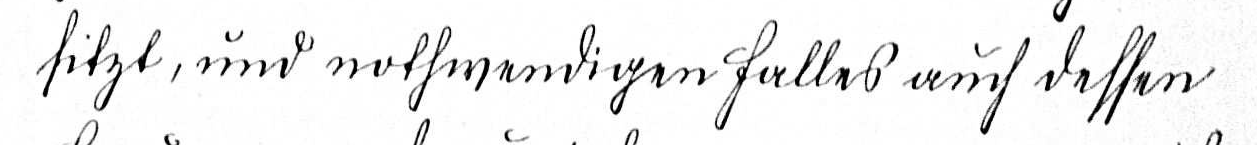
sitzt, und nothwendigen Falles auch dessen
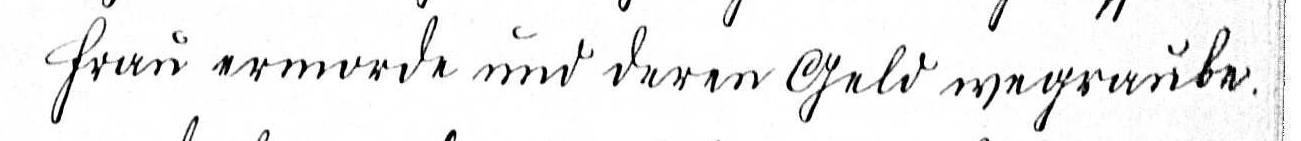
Frau ermorde und deren Geld wegraube.
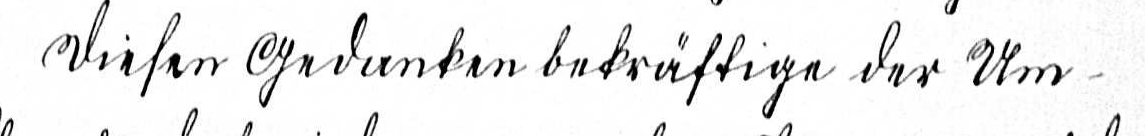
Diesen Gedanken bekräftige der Um¬
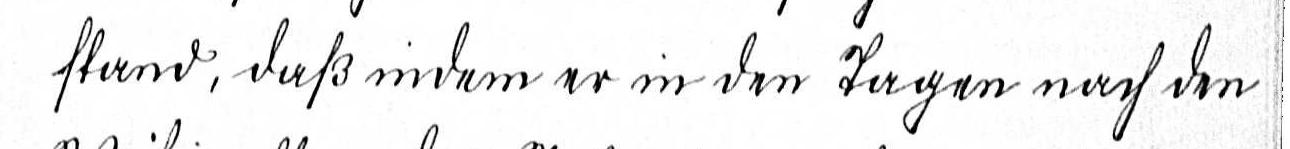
stand, daß indem er in den Tagen nach den
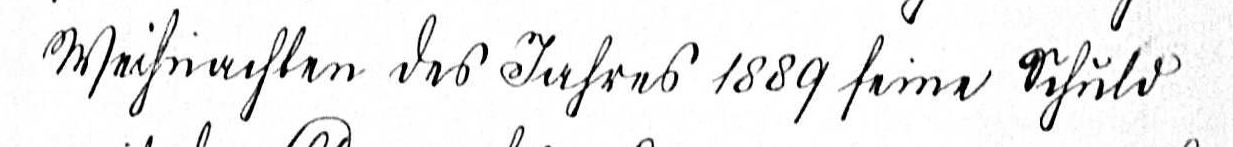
Weihnachten des Jahres 1889 seine Schuld
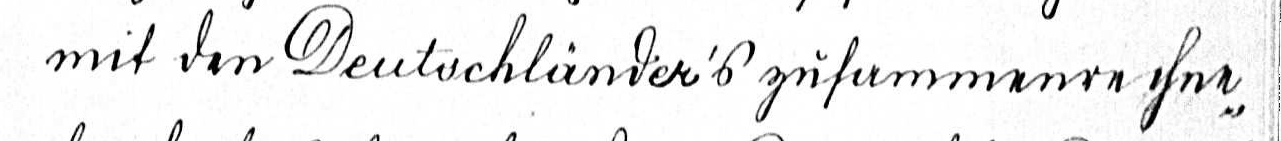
mit den Deutschländer’s zusammenen rechne¬
